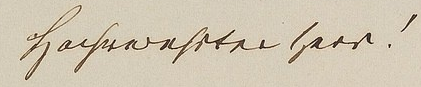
Hochverehrter Herr!
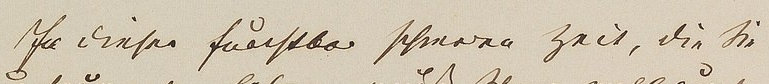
In dieser furchtbar schweren Zeit, die Sie
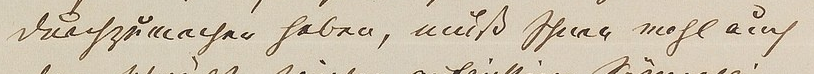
durchzumachen haben, muß Ihnen wohl auch
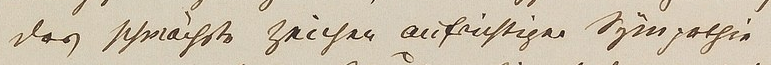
das schwächste Zeichen aufrichtiger Sympathie
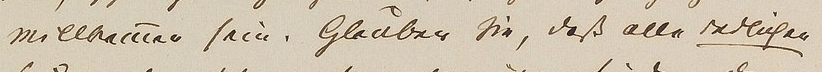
willkommen sein. Glauben Sie, daß alle redlichen
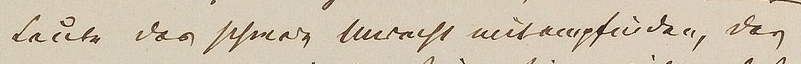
Leute das schwere Unrecht mitempfinden, das
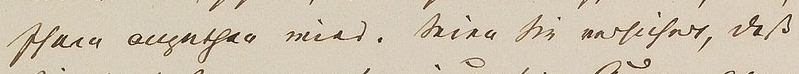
Ihnen angethan wird. Seien Sie versichert, daß
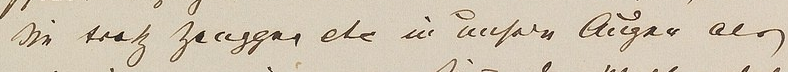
Sie trotz Zangger etc in unsern Augen als
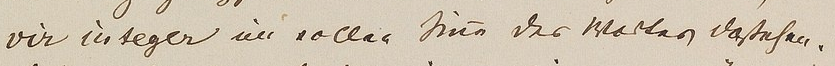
vir integer im vollen Sinne des Wortes dastehen.
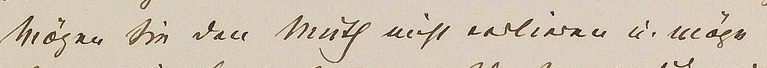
Mögen Sie den Muth nicht verlieren u. möge
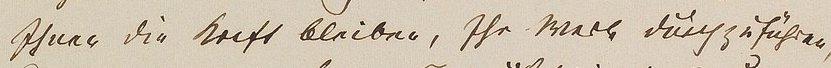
Ihnen die Kraft bleiben, Ihr Werk durchzuführen,
